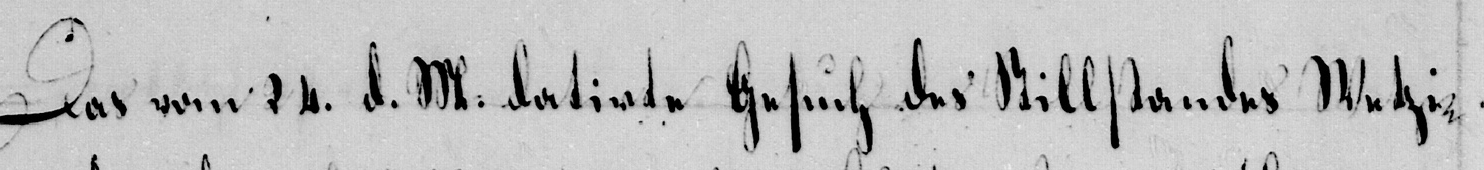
Das vom 24. d. M. datirte Gesuch des Stillstandes Wetzi¬
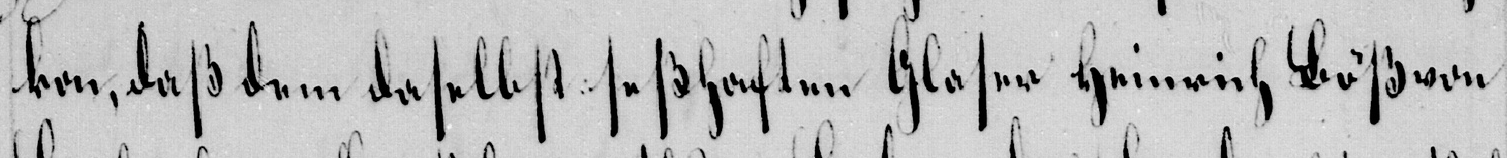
kon, daß dem daselbst seßhaften Gaser Heinrich Böß von
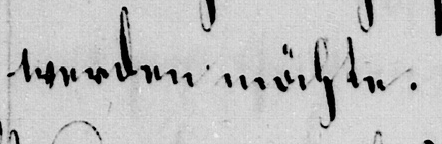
werden möchte.
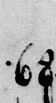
b.)
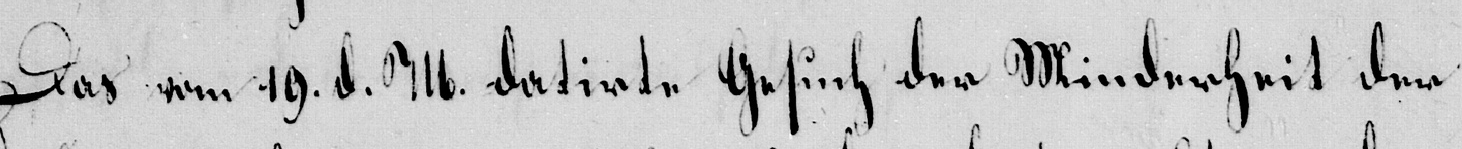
Das vom 19. d. M. datirte Gesuch der Minderheit der
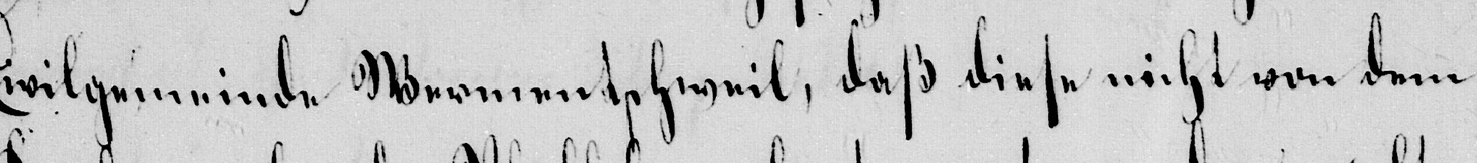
Civilgemeinde Wermetschweil, daß diese nicht von dem
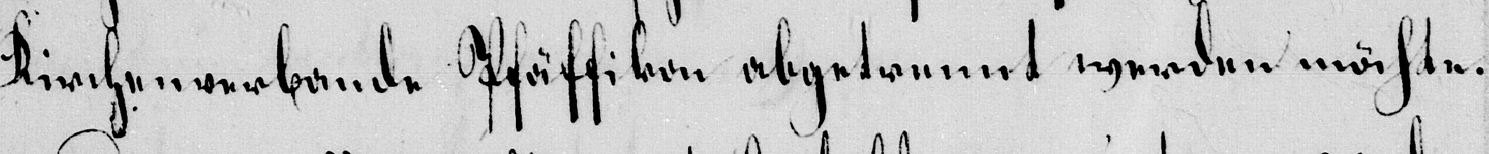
Kirchenverbande Pfäffikon abgetrennt werden möchte.
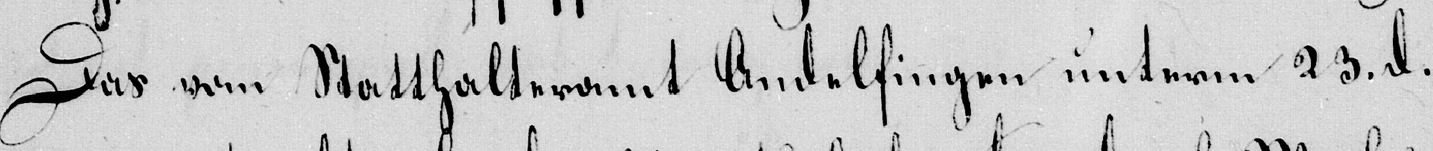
Das vom Statthalteramt Andelfingen unterm 23. d.
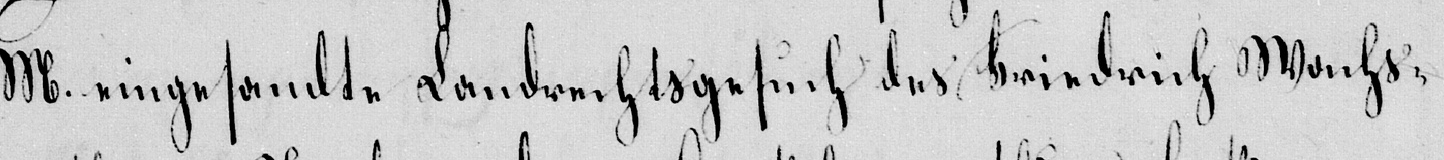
M. eingesandte Landrechtsgesuch des Heinrich Wachs¬
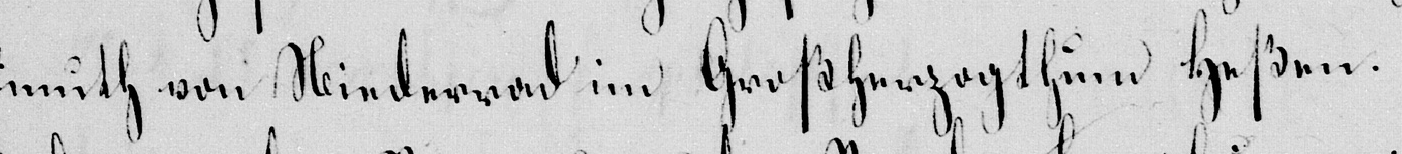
muth von Niederrad im Großherzogthum Heßen.
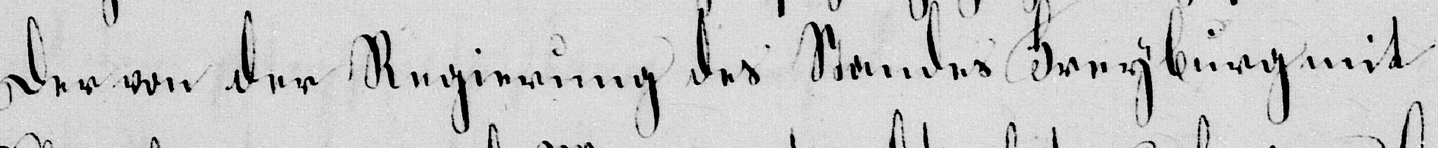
Der von der Regierung des Standes Freyburg mit
